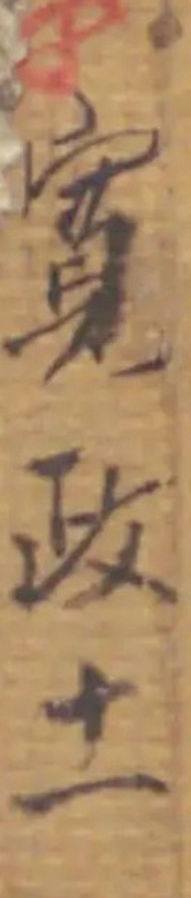寛政十一

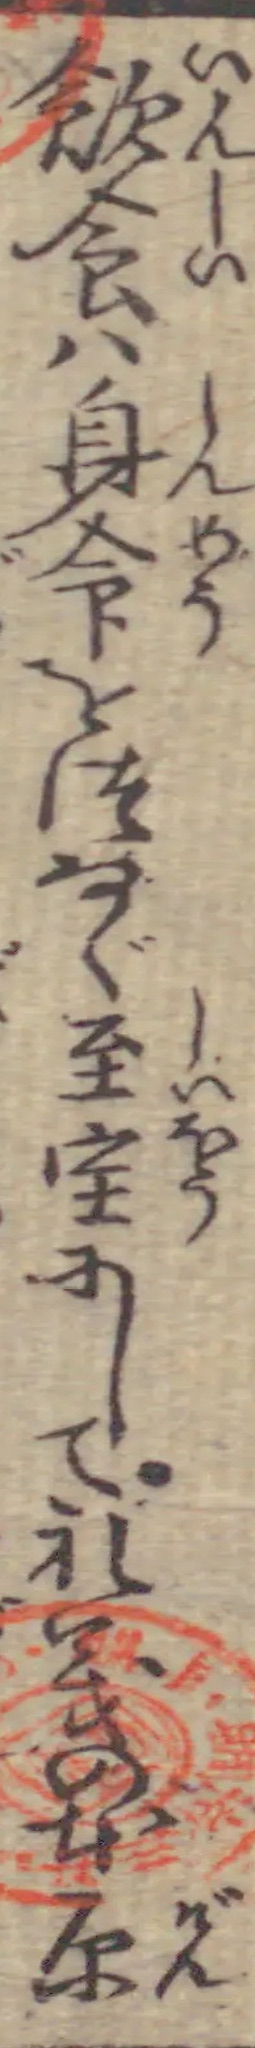飲食は身命をつなぐ至宝にして。礼義の本原
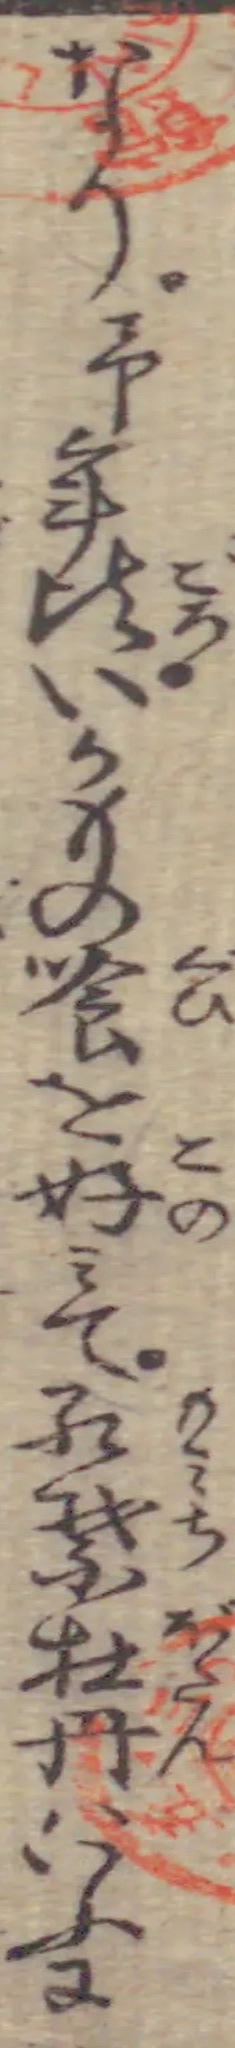なり。予年頃。いかもの喰を好みて。紅葉牡丹はいふに
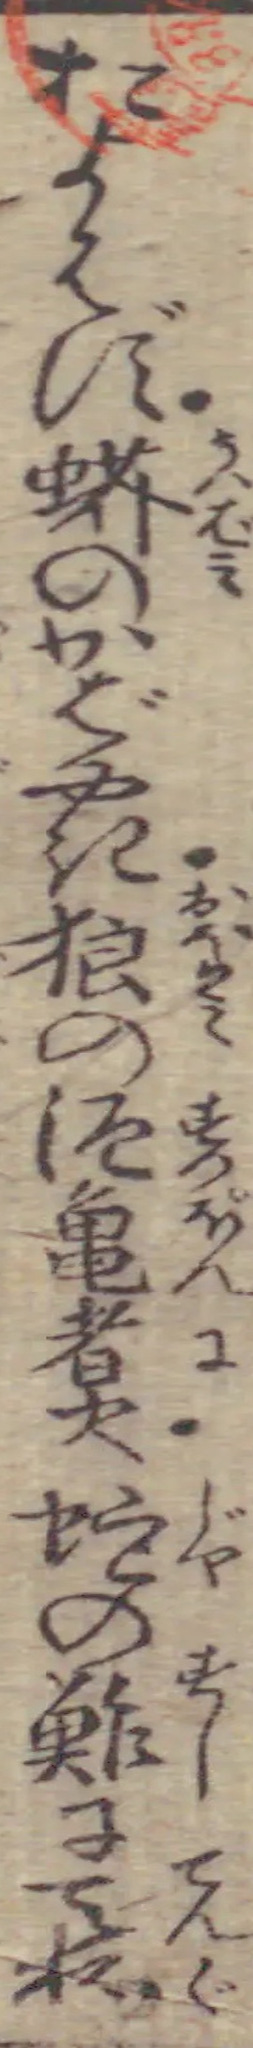およばず。蟒のかばやき。狼の酒亀煮。蛇の鮨に天狗
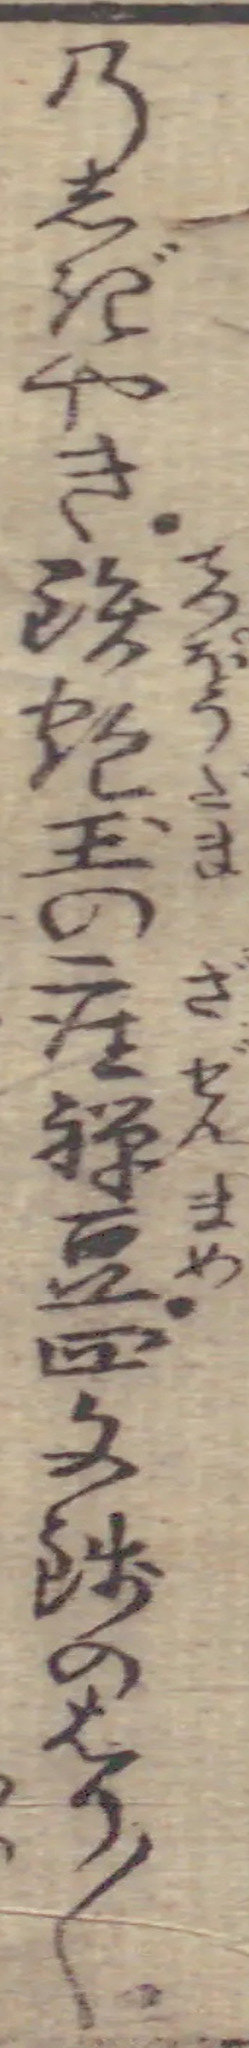のしぎやき。鉄砲玉の座禅豆。四文銭のはり〳〵。
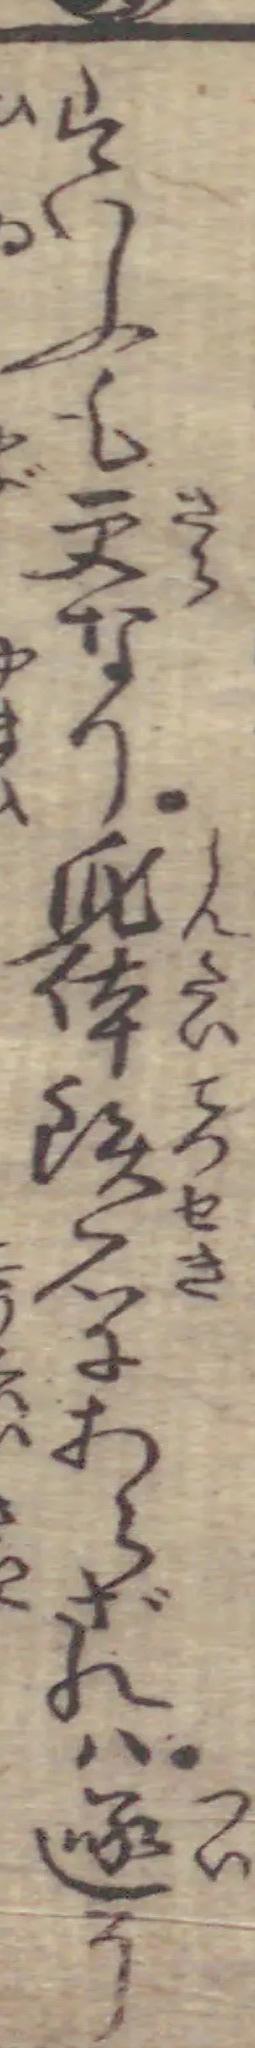といふも更なり。身体鉄石にあらざれは。遂に
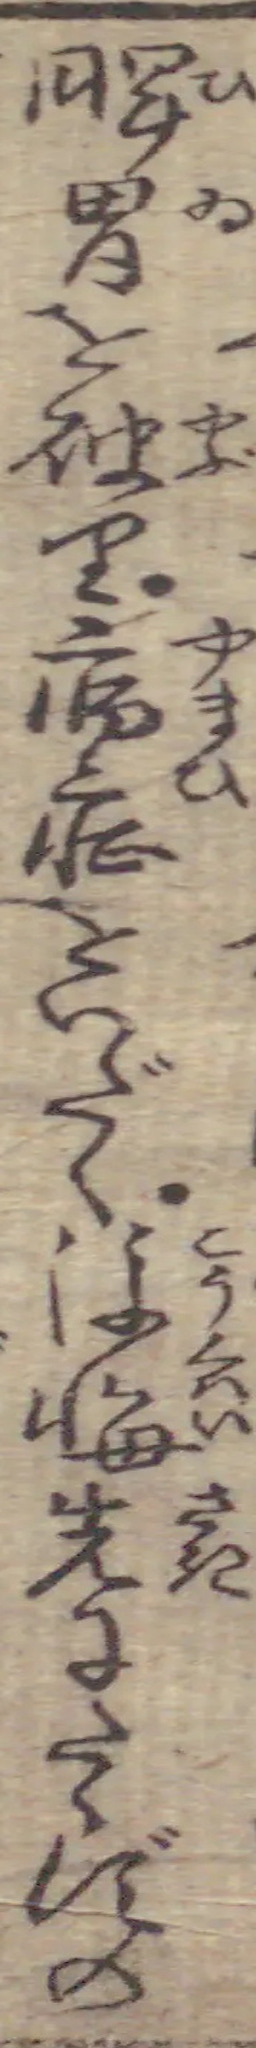脾胃を破り。病症をいだし。後悔先にたゝずの
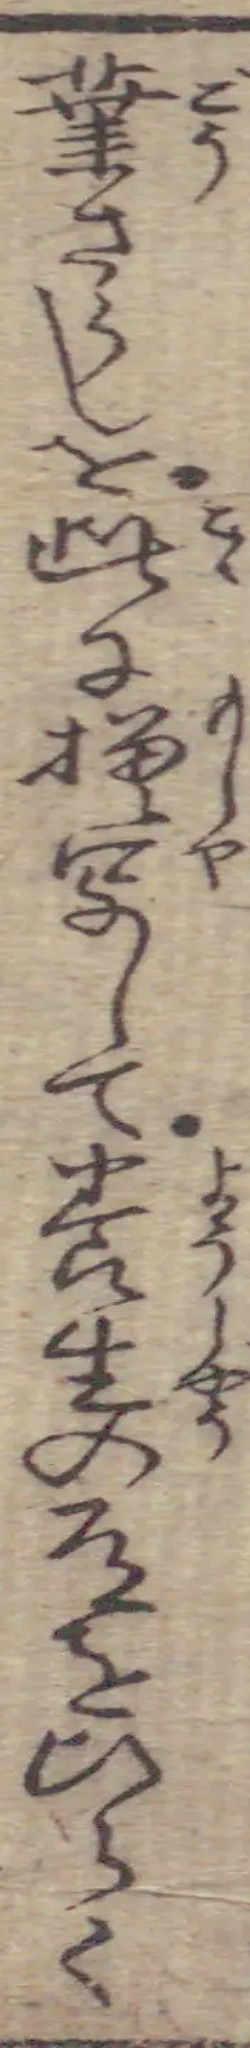業さうしを。此に模写して。養生の道をひらく
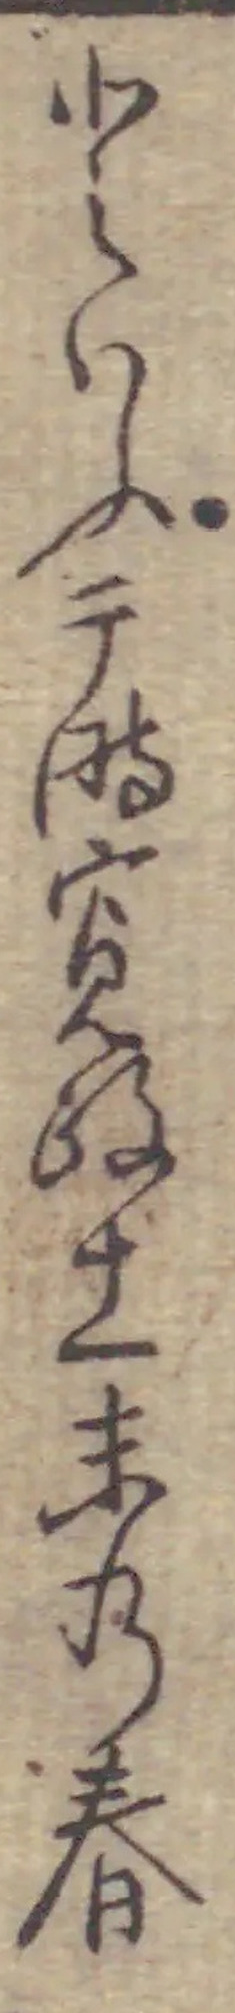といふ。于時寛政十一未の春
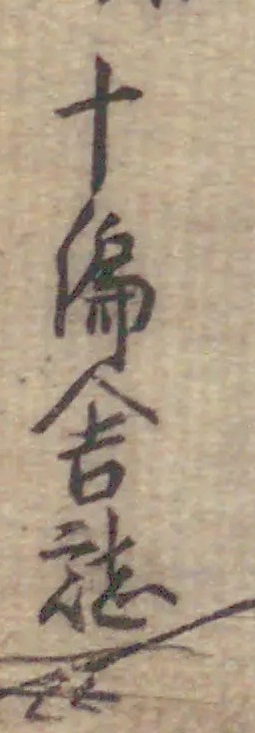十偏舎誌

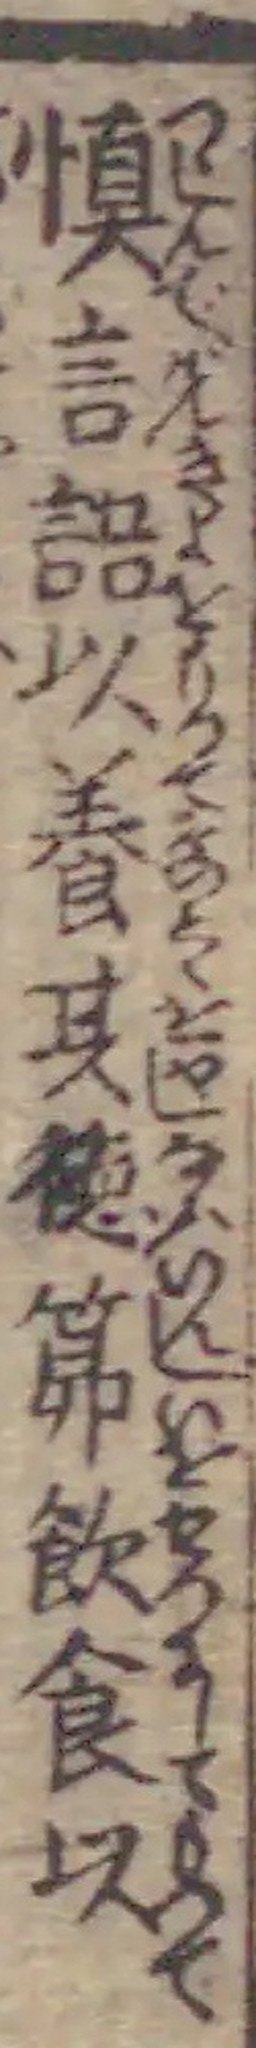慎言語以養其徳節飲食以
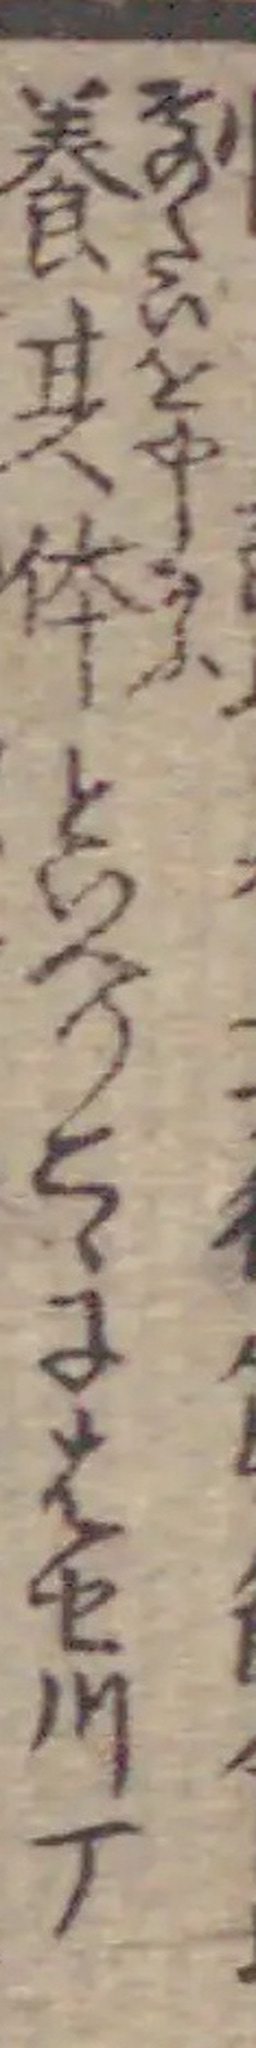養其体といへりとくにはせ川丁
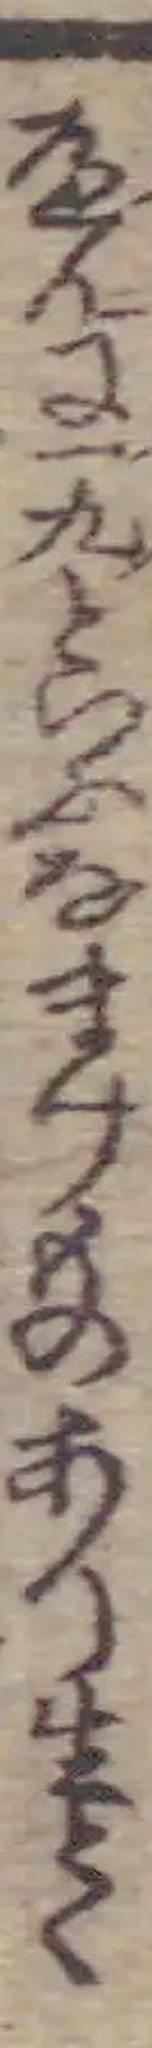へんに一九といふなまけものあり生とく
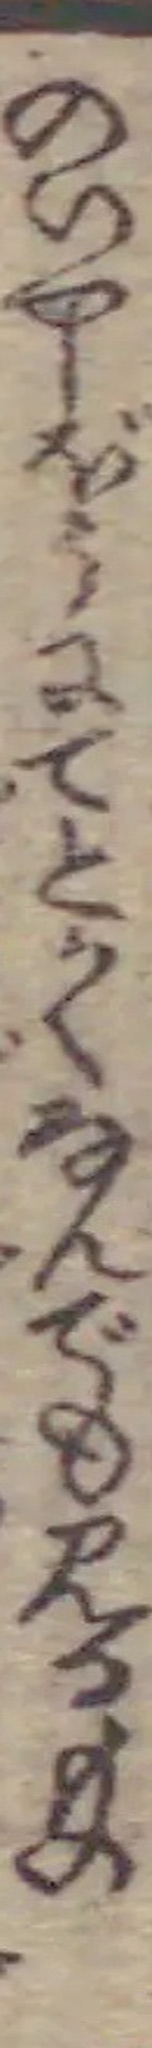のいやしぼうにてとかくなんでも見るもの
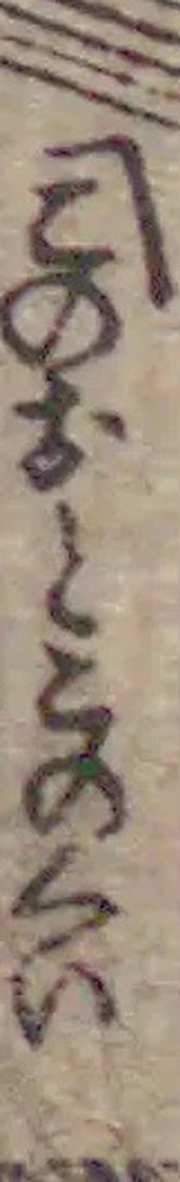〽このおとこのくい
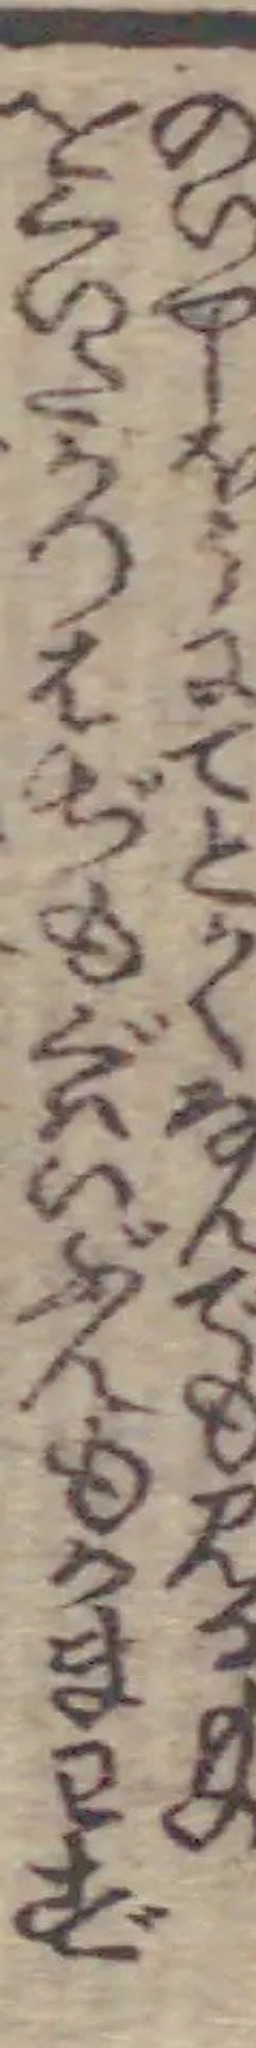をくいたかりはぢもぐはいぶんもかまわず
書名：腹内養生主論 3巻
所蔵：国立国会図書館 National Diet Library, JAPAN
